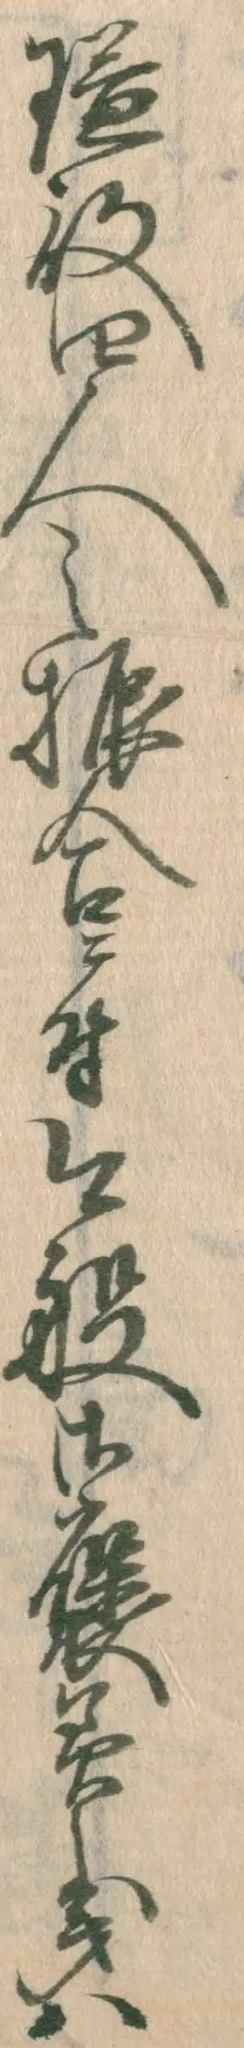鎰役四人之振合ニ付今般御褒美之義ハ
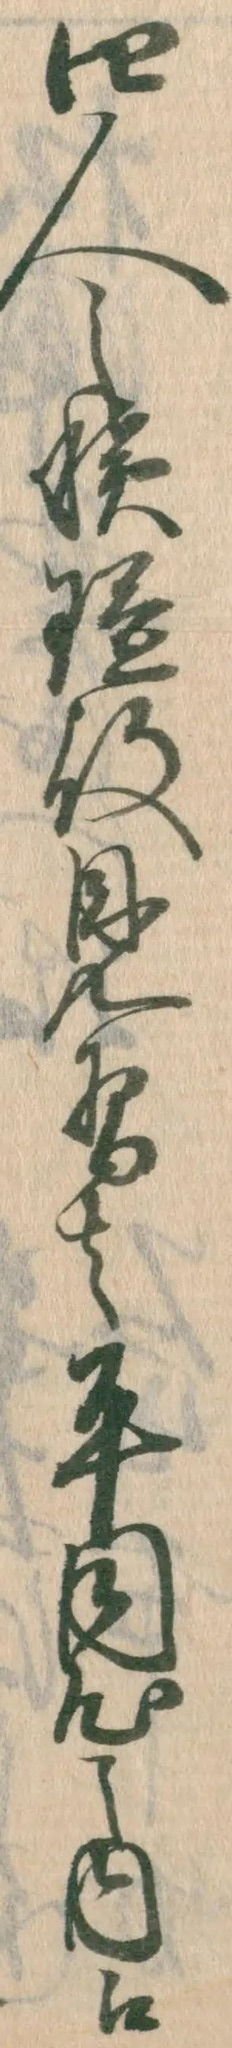四人之積鎰役見習は平同心之内え
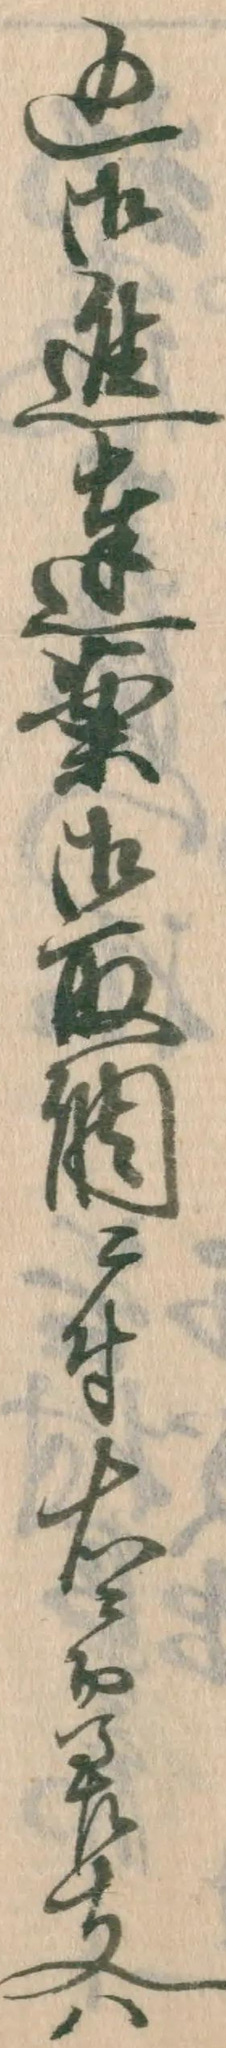込御進達案御取調ニ付右ニて差支ハ
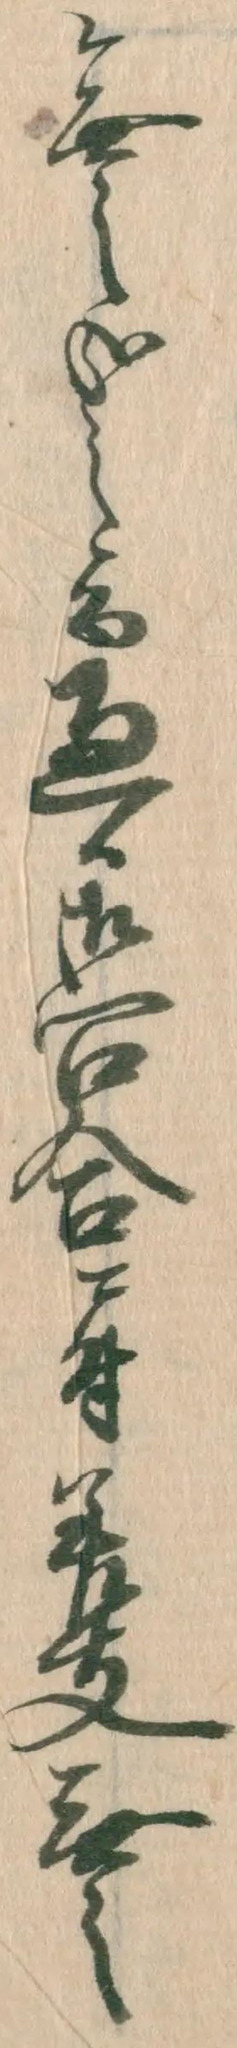無之哉之旨過日御問合ニ付差支無之
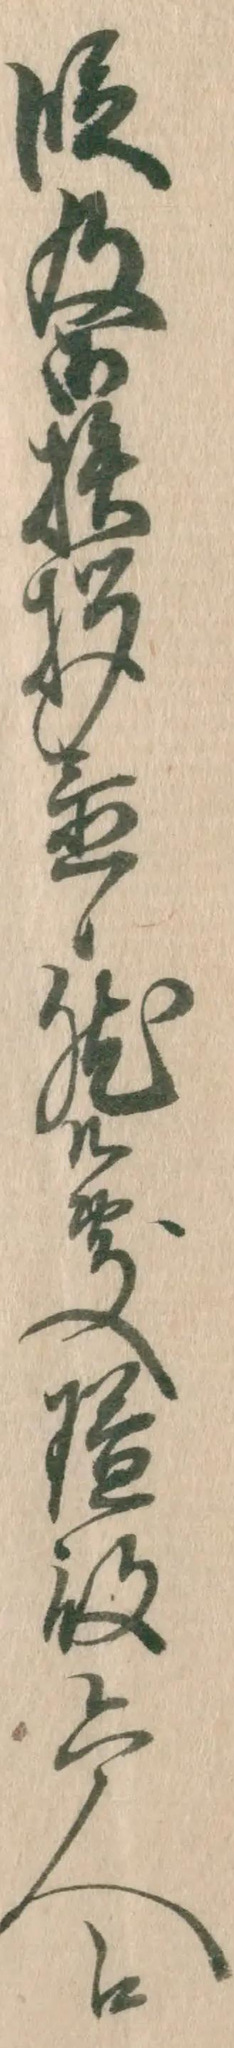段及御挨拶置候然ル処鎰役六人え
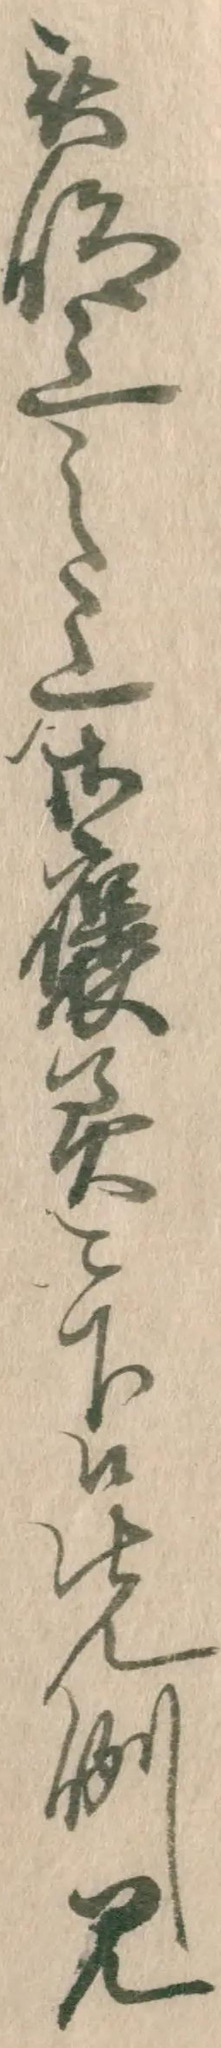被仰上之上御褒美被下候先例見
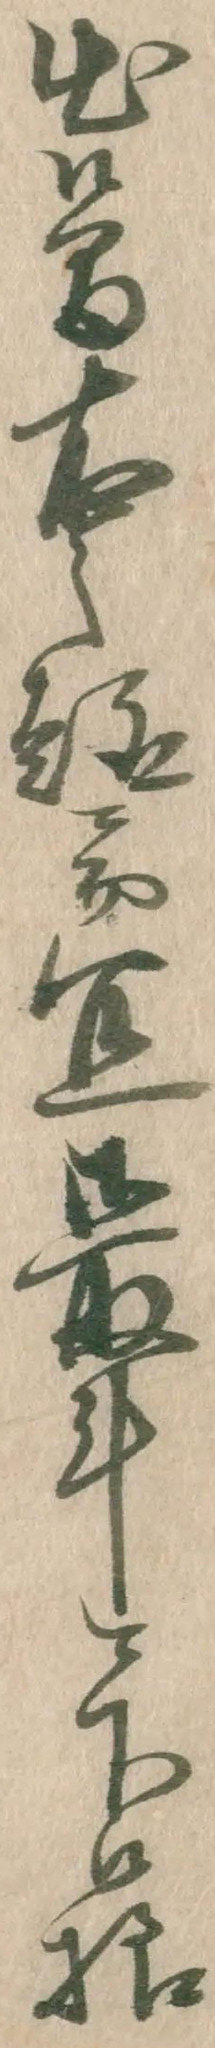出候間右之趣ニて宜御取計被下候様
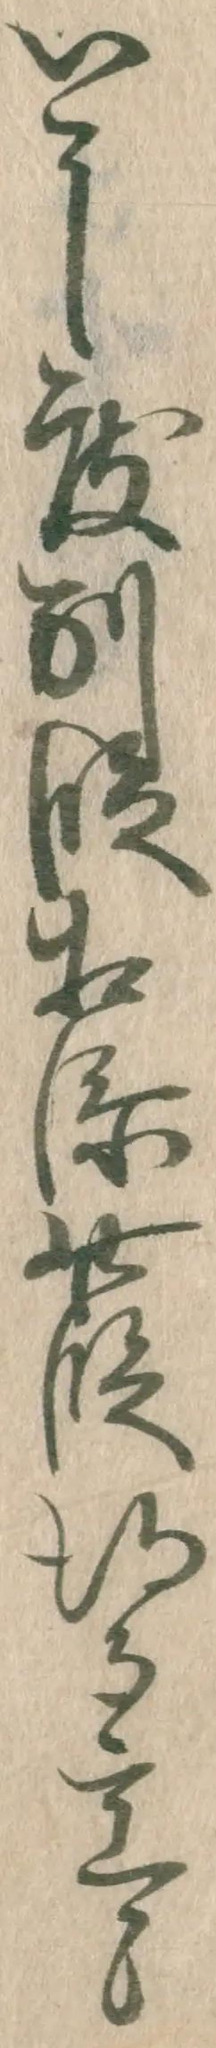いたし度別段相添此段得御意候

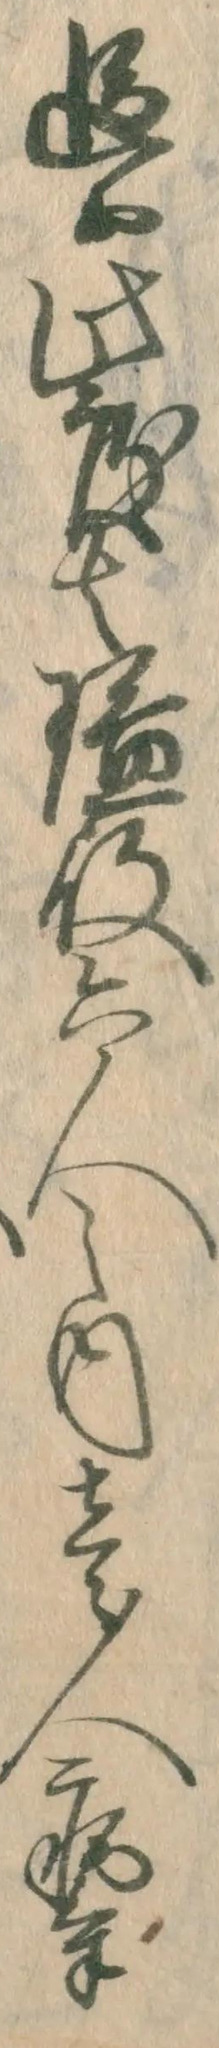過日此度は鎰役六人之内壱人病気
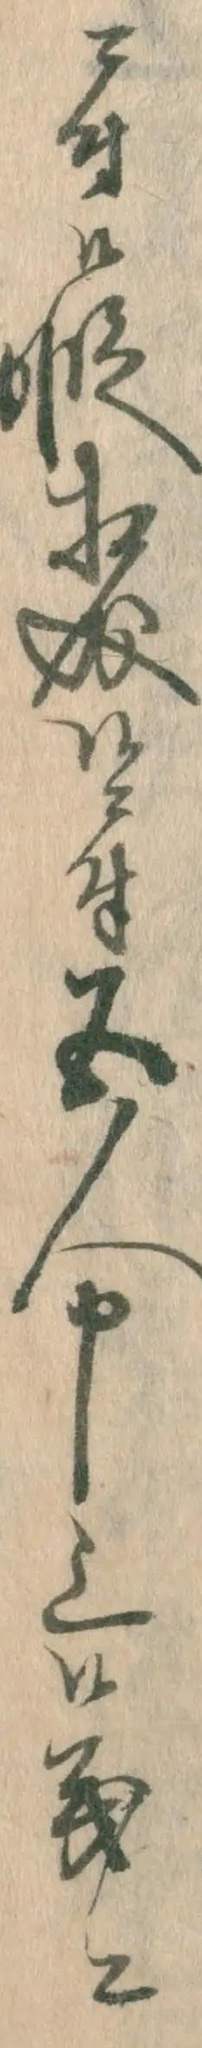ニ付御暇相成候ニ付五人申上候儀ニ
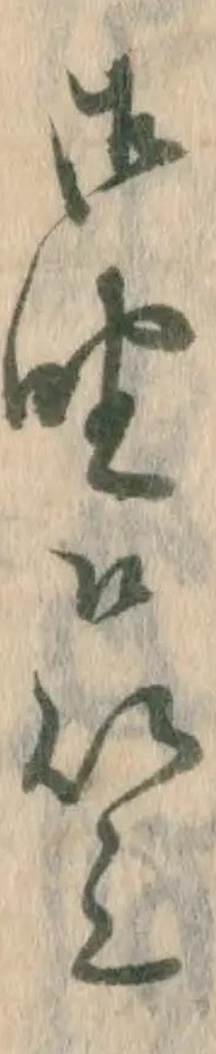御座候以上
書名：七十冊物類集 71巻. [44] 四十三 牢屋敷御普請御修覆地震ニ付骨折候牢屋掛御褒美之部
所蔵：国立国会図書館 National Diet Library, JAPAN
